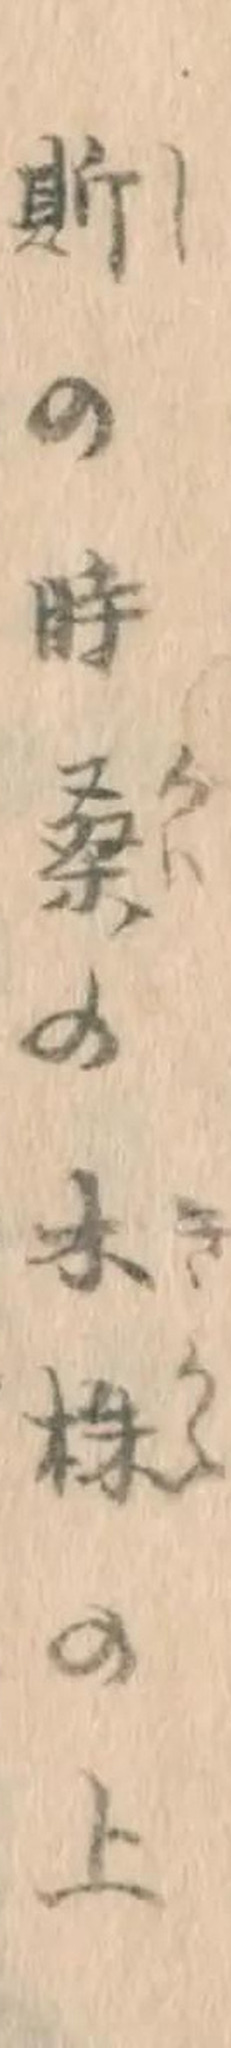斯の時桑の木株の上
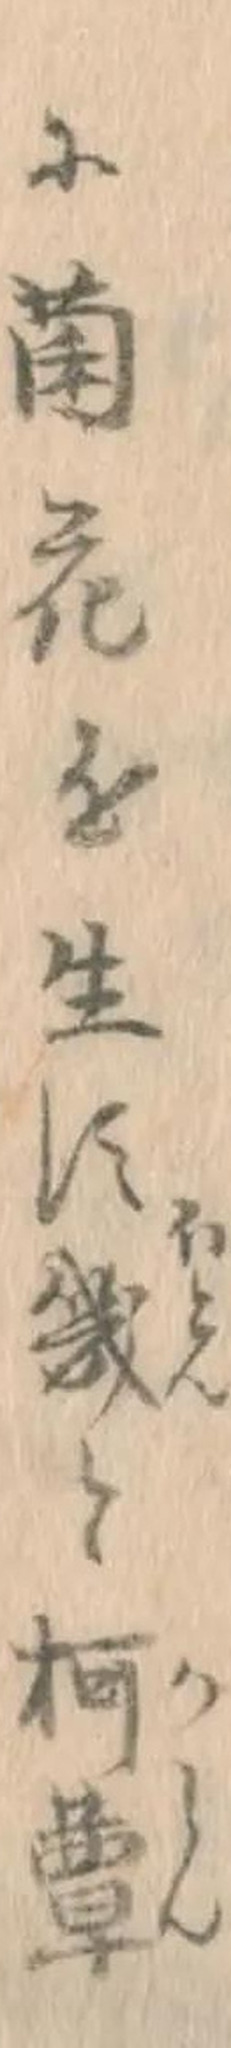に菌花を生す幾と柯蕈
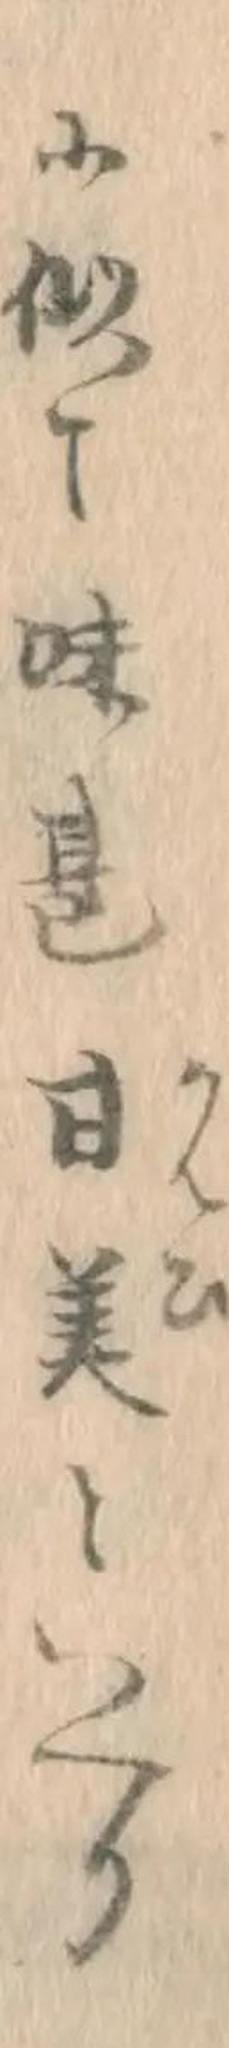に似て味甚甘美といへり
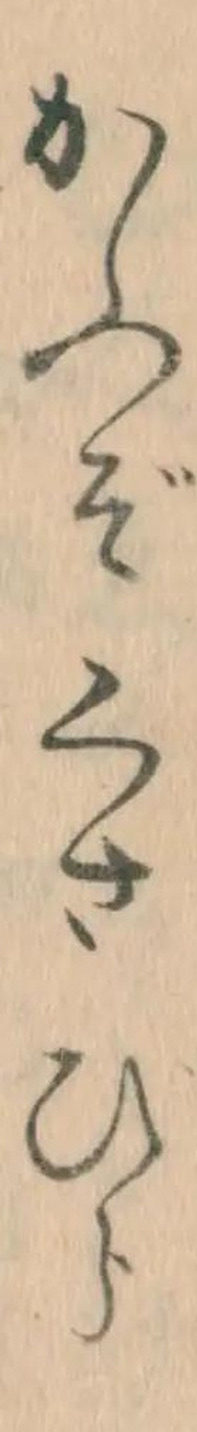かふぞくさびら
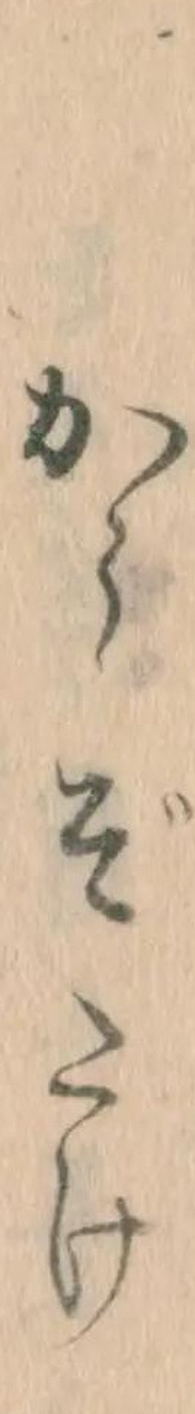かうぞたけ
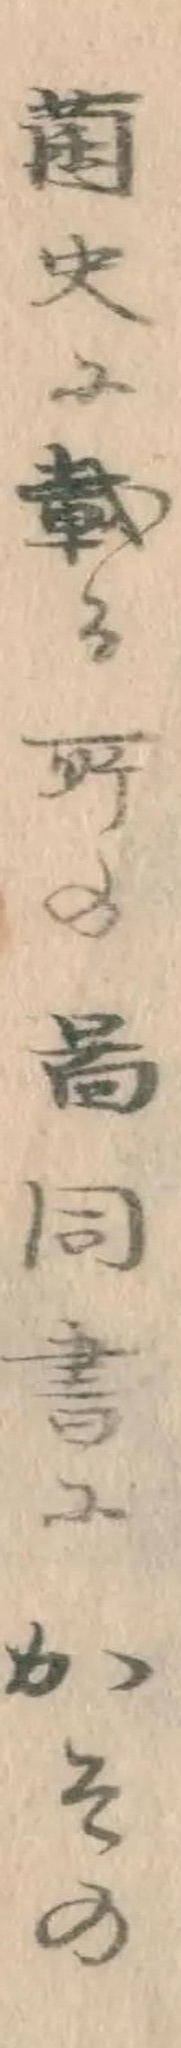菌史に載る所の図同書にかその
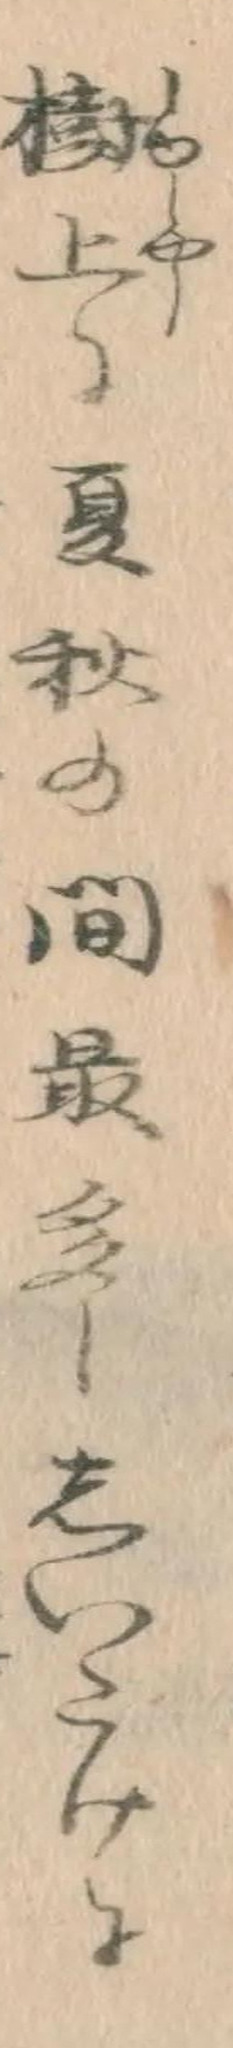樹上に夏秋の間最多ししいたけに
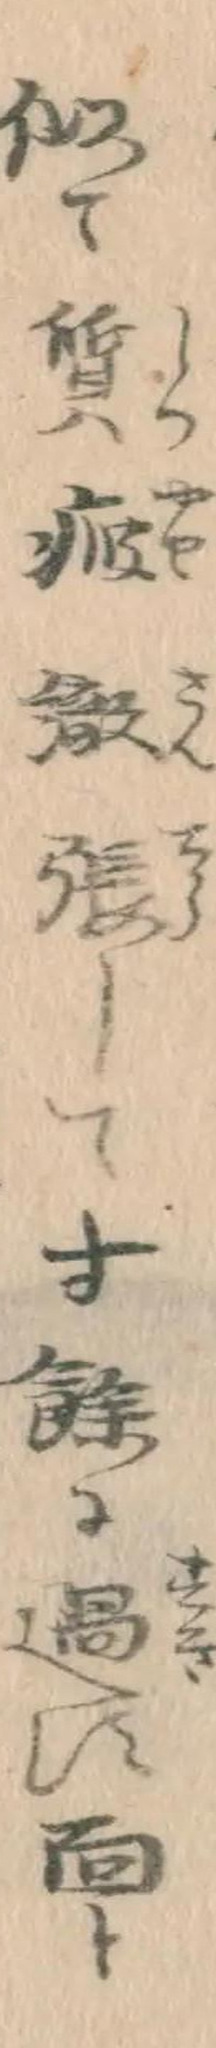似て質痩張して寸余に過す面と
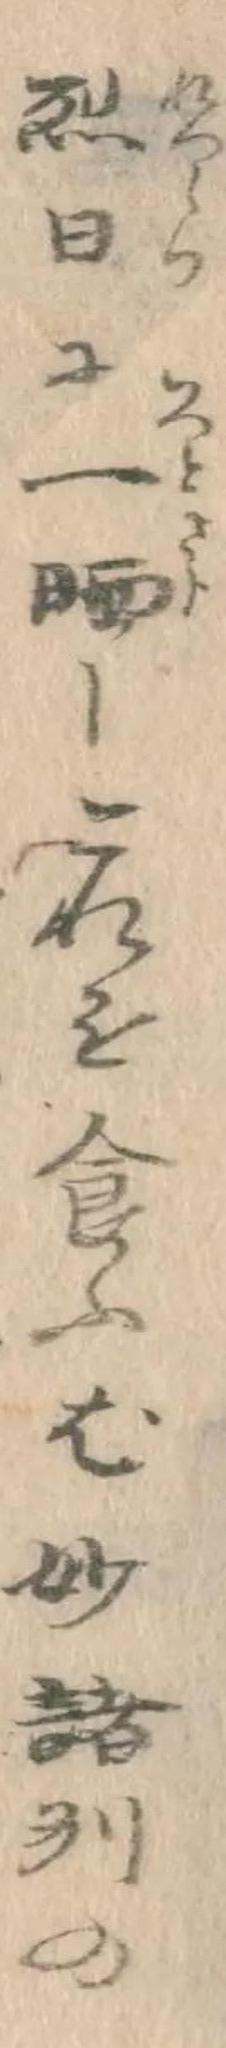烈日に一晒しこれを食ふ尤妙諸州の
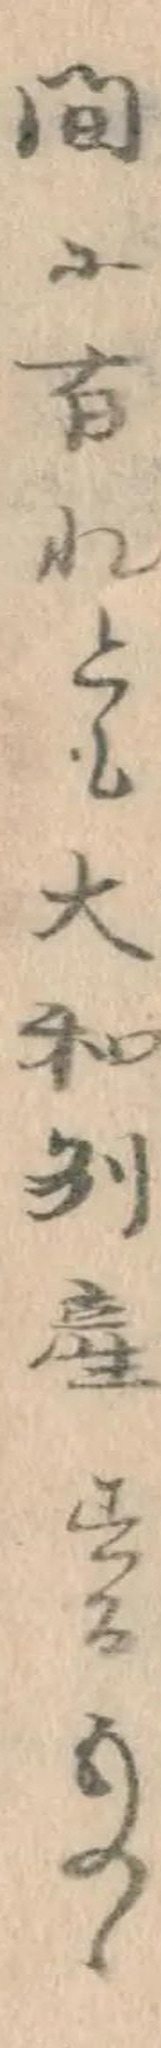間に有れとも大和州産するものゝ
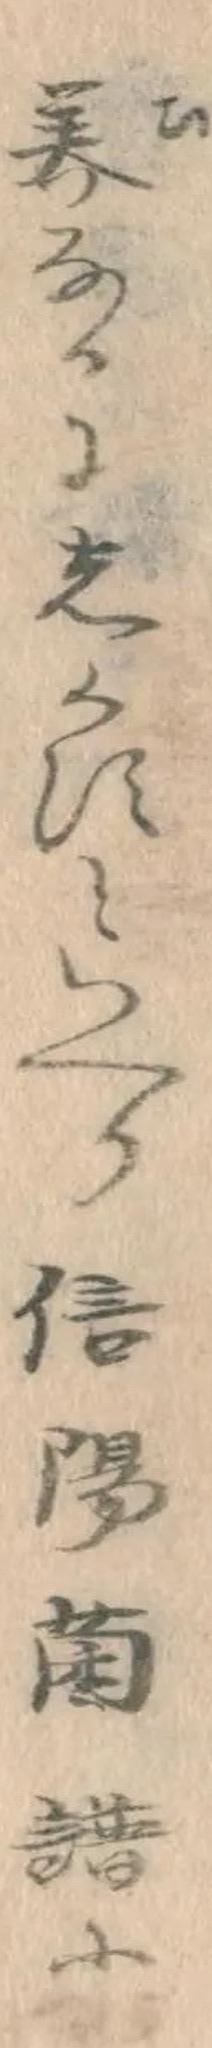美なるにしかすといへり信陽菌譜に
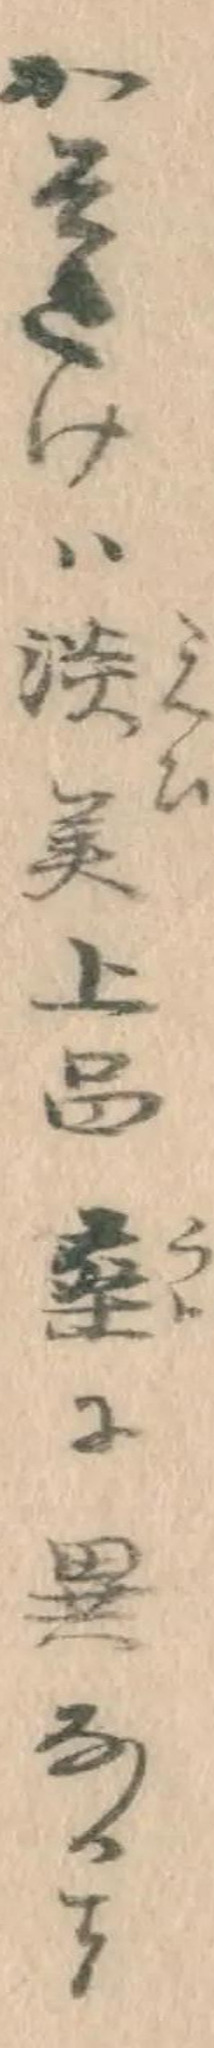かそたけは淡美上品桑に異なること
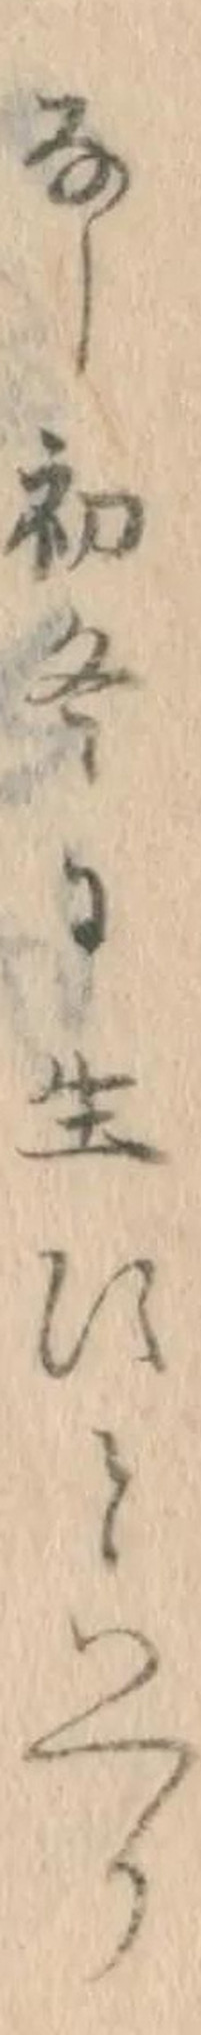なし初冬に生すといへり

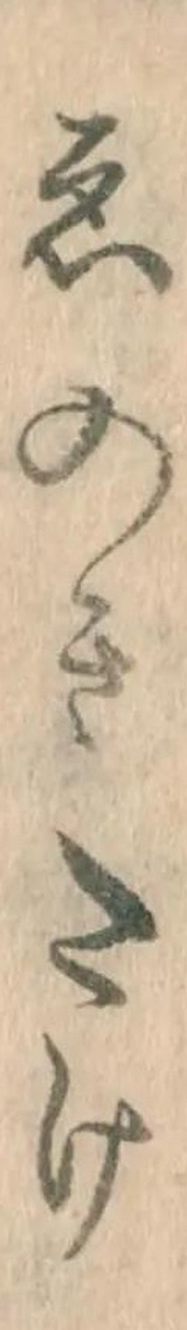ゑのきたけ
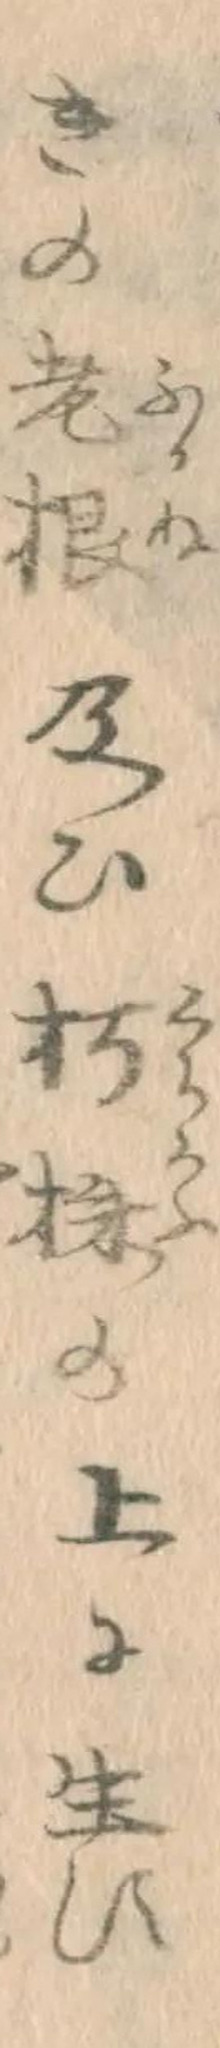きの老根及ひ朽株の上に生す
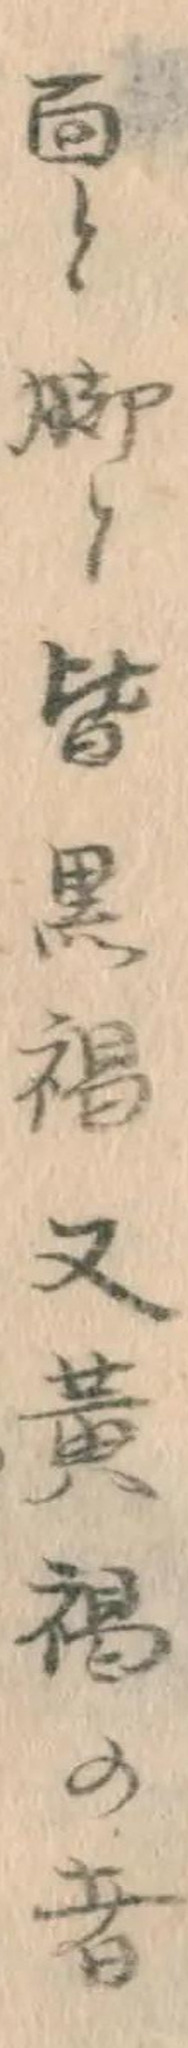面と脚と皆黒褐又黄褐の者
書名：本草図譜. 巻55-57
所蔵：国立国会図書館 National Diet Library, JAPAN
